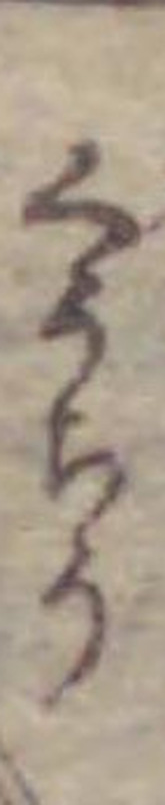くうちう
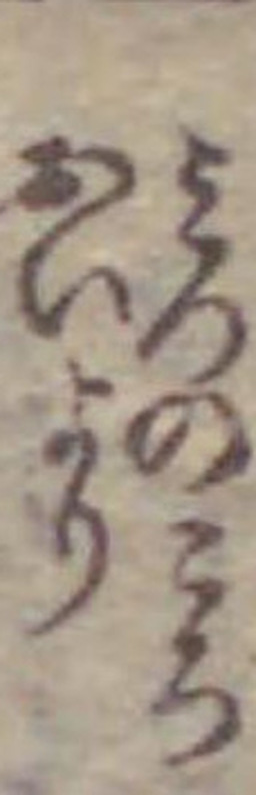おいより
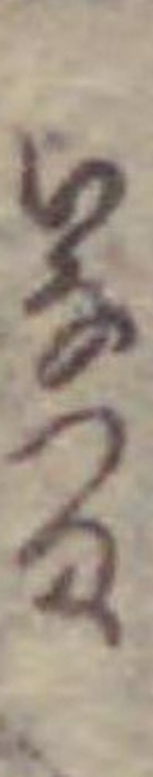いなつま
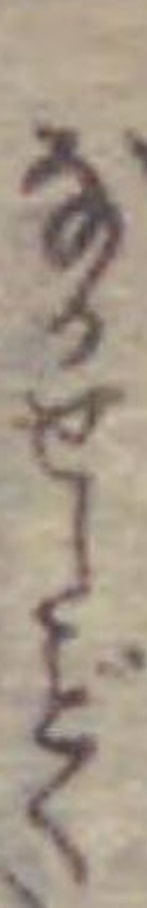なかせしごとく
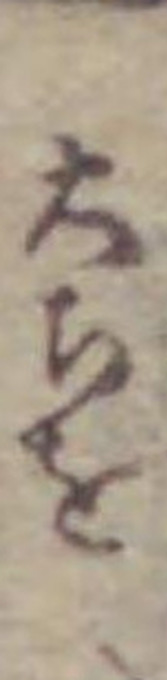大ちを
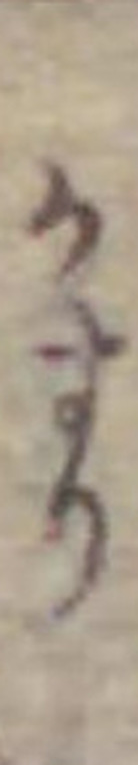かすり
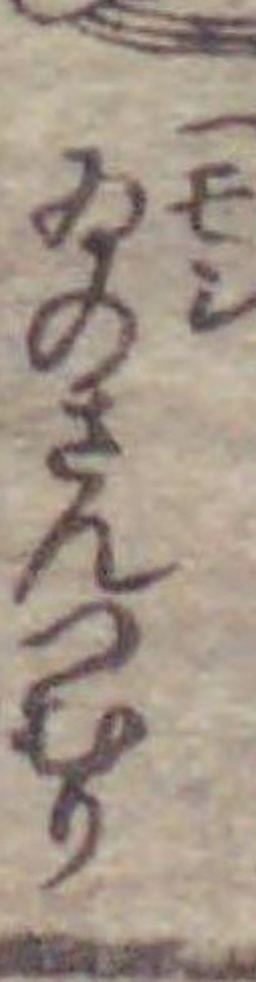ゐのさんつむり
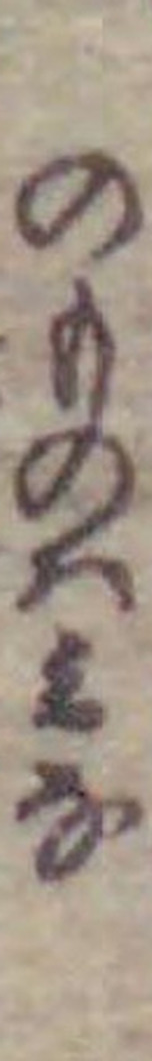のものはみな
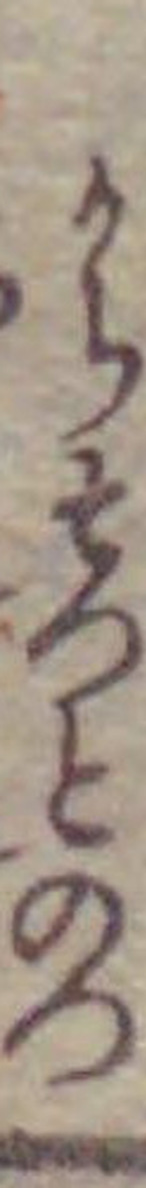からそつとのつ
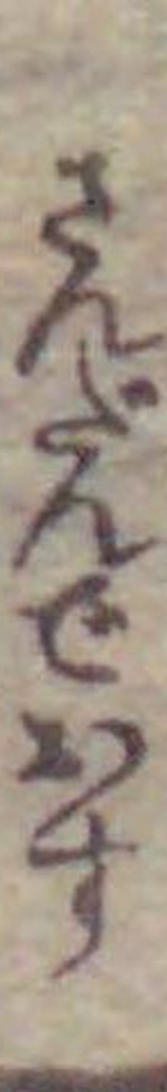さんだんでおす
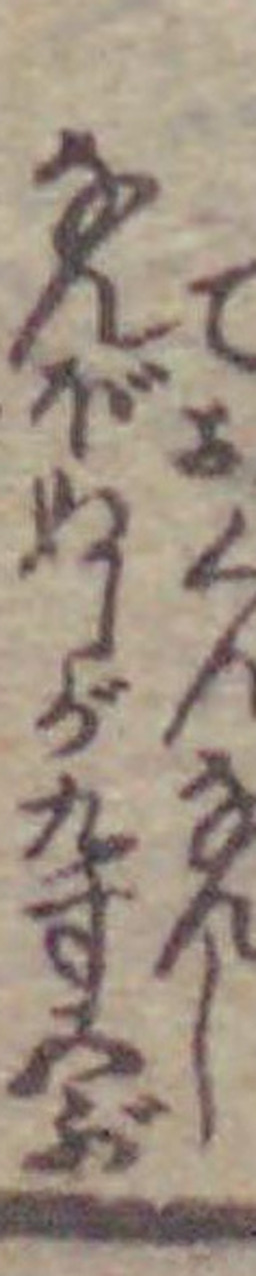なんぼぬしが九寸五ぶ
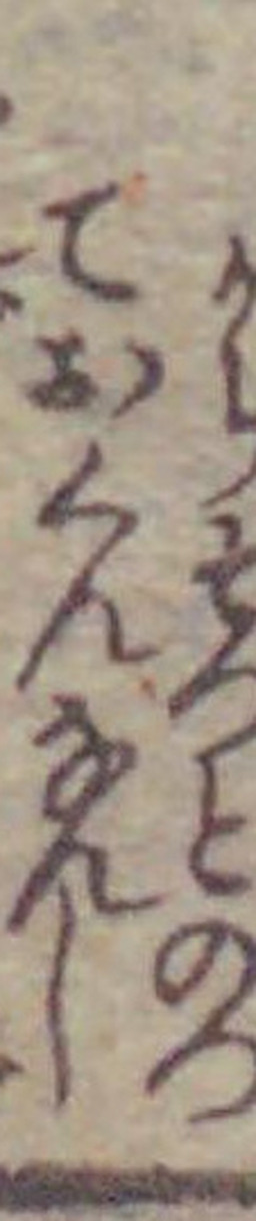ておくんなんし
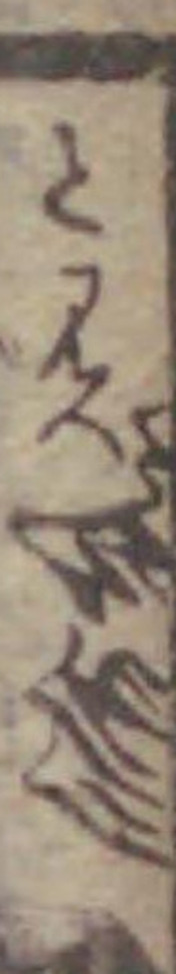と見へ
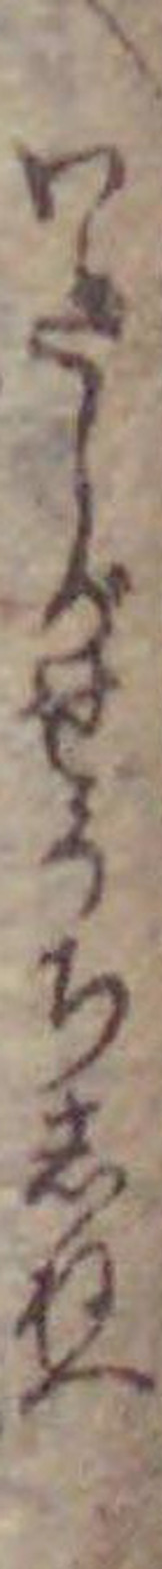わたしがせうちしねへ
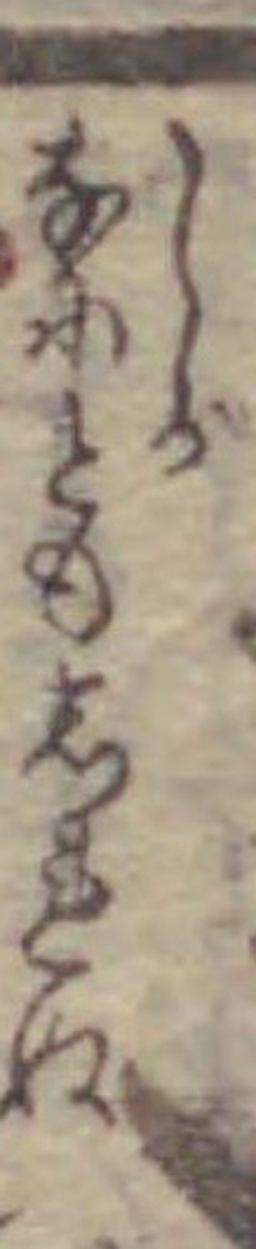なにともしれぬ
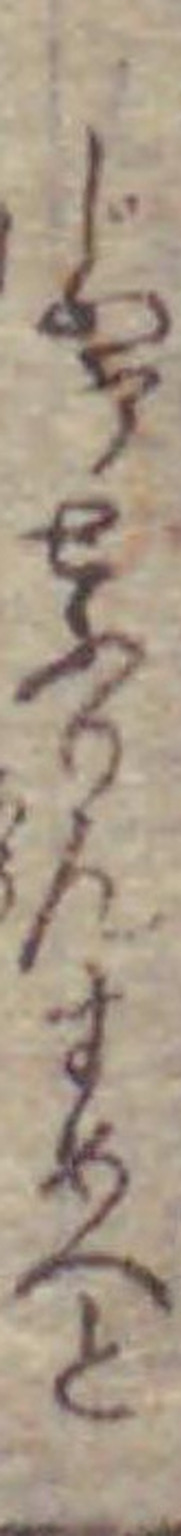じやあとふりんすめへと
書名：武家物奇談 : 3巻
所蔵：国立国会図書館 National Diet Library, JAPAN
